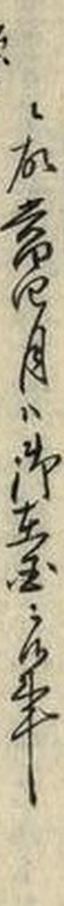候故当四月は御在国に候事
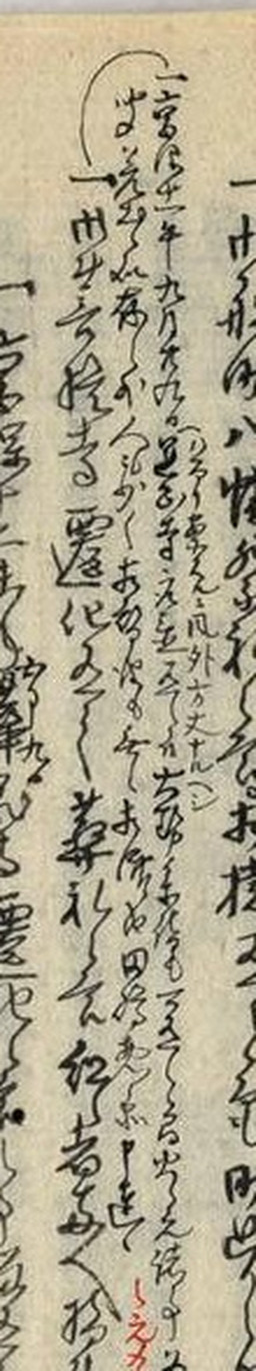聞差出候処存之外人も少く相替候儀も無之相済候由田島惣兵衛申達候
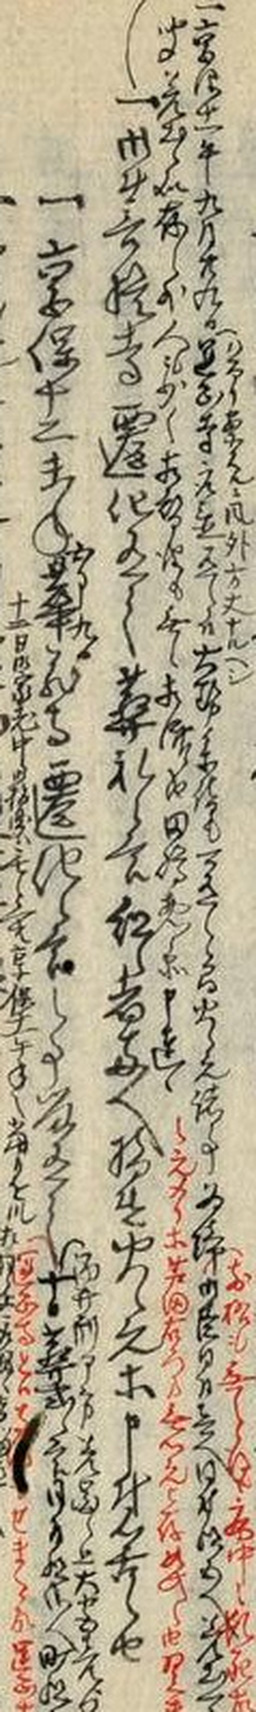一御菩提寺遷化有之葬礼之節組之者両人指遣火之元等申付筈之由
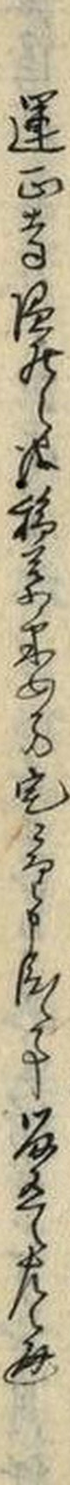一運正寺隠居之儀稲葉采女方宅にて被申渡候事留有之左之通

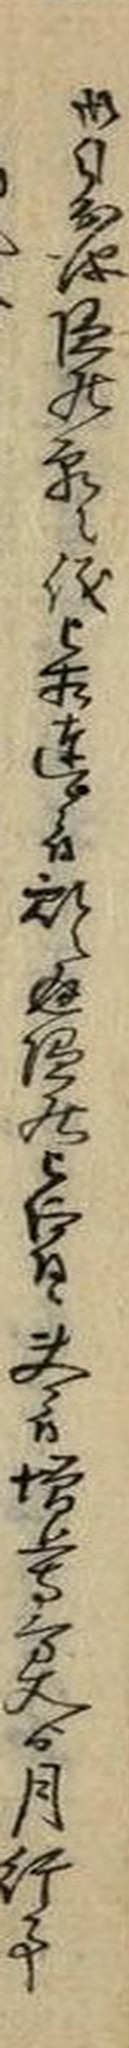御自分儀隠居願之儀被相達候に付願之通隠居被仰付候夫に付増上寺方丈ゟ月行事
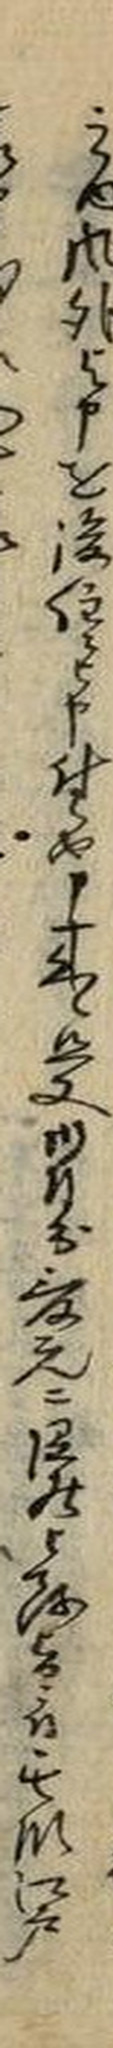之内風外と申を後住に被申付候由申来候且又御自分爰元に隠居被致旨に付其段江戸
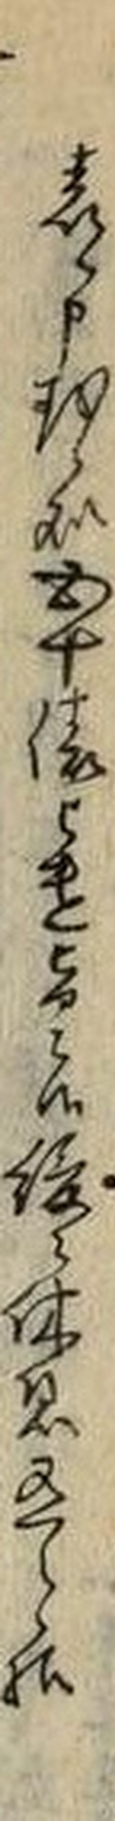表へ申越候処五十俵被遣旨に候緩々休息有之候様
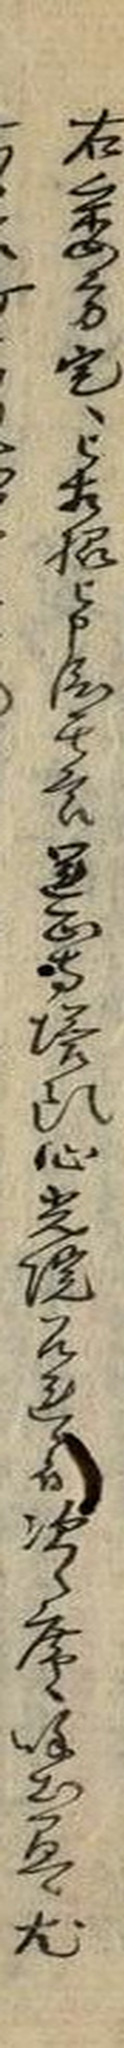右采女方宅へ被相招被申渡其節運正寺塔頭心光院召連候に付次の席へ呼出置候尤
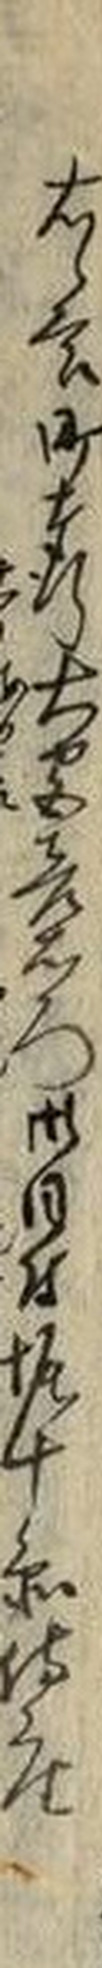右之節町奉行大宮彦右衛門御目付堀十兵衛侍座
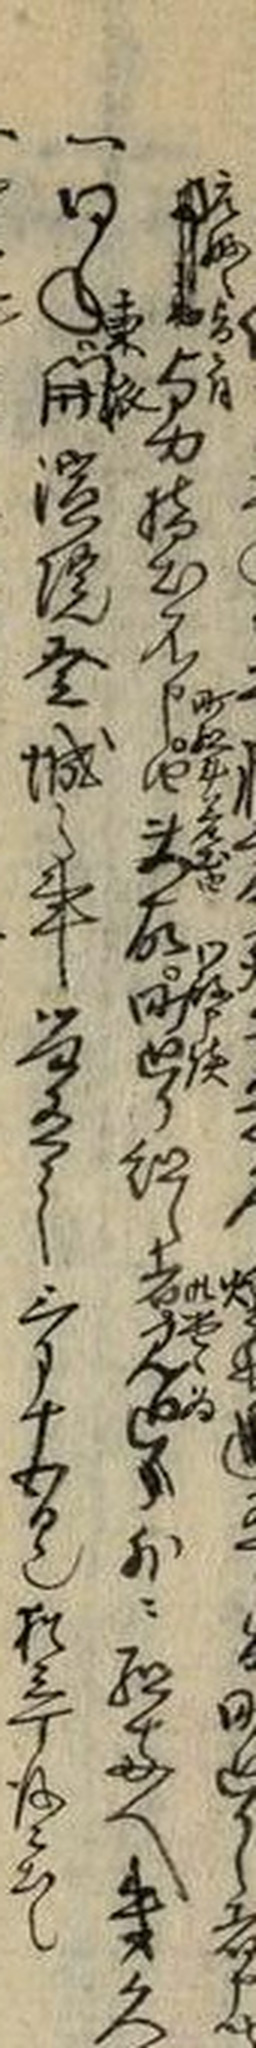一同年◦東派開演院登城之事留有之三月十五日也猶三丁後に出之
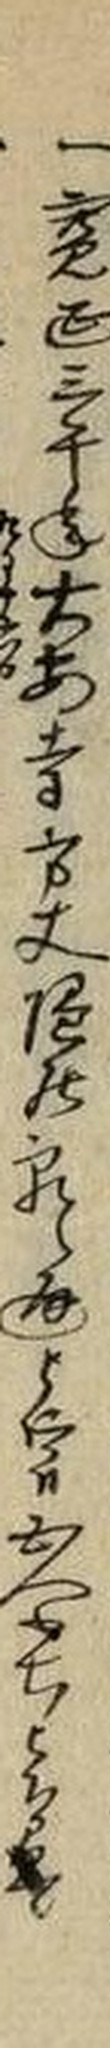一寛延三午年大安寺方丈隠居願之通被仰付五人ふち被下置候
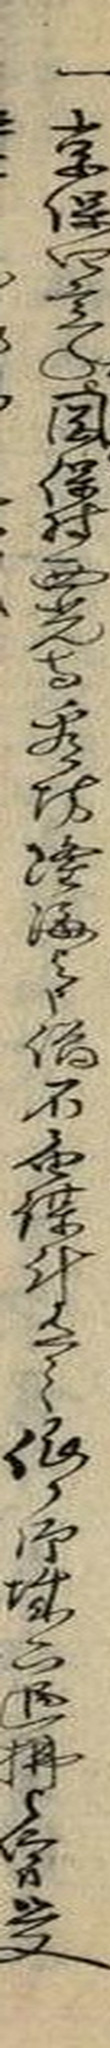一享保四亥年◦九月十六日岡保村西光寺看坊隆海と申僧不届謀計有之依り御城下追払被仰付且又
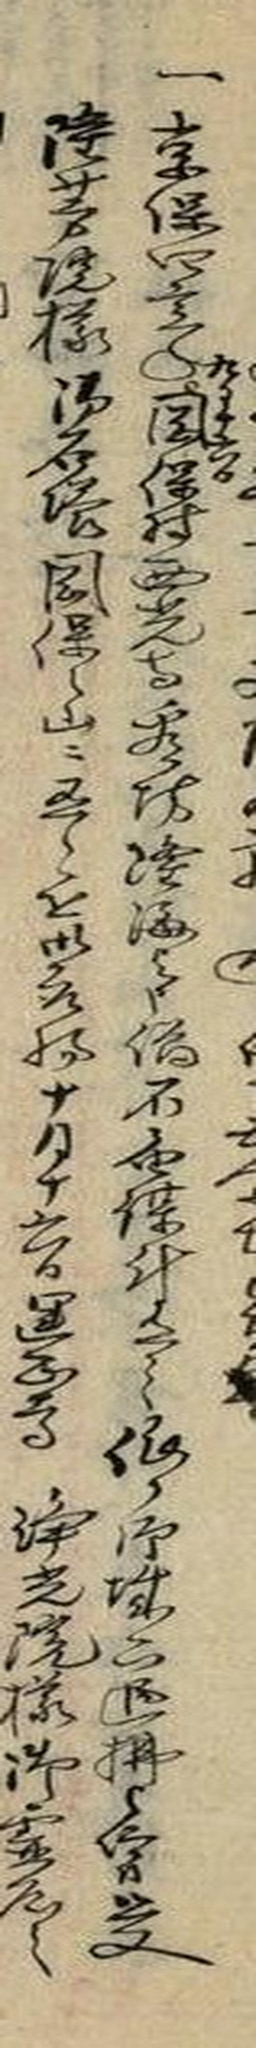隆芳院様御石塔岡保之山に有之候を御取揚十月十六日運正寺浄光院様御霊屋之
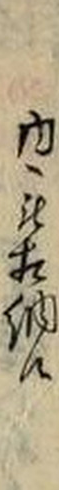内へ被相納候
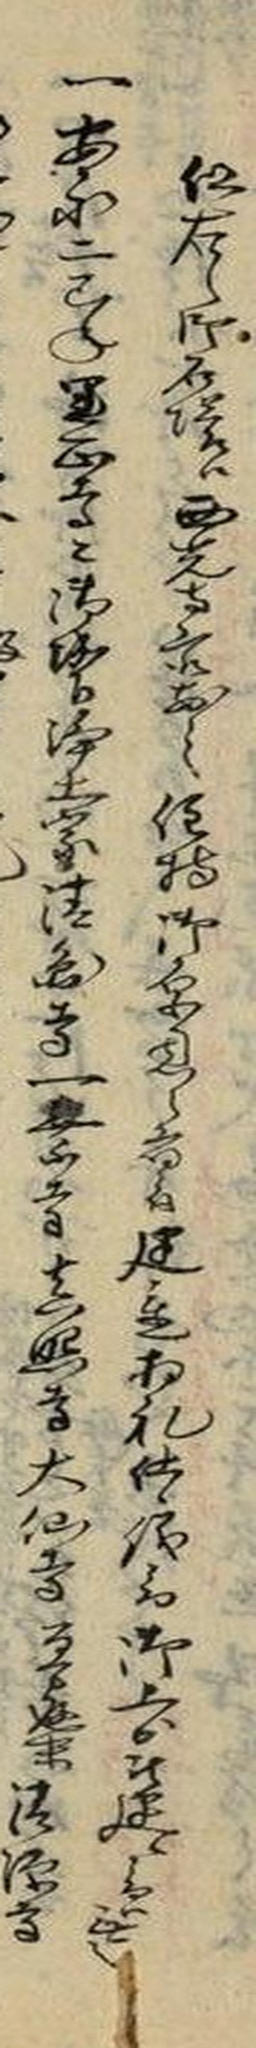一安永二巳年運正寺と御城下浄土宗清円寺一乗寺真照寺大仙寺百万遍末清源寺
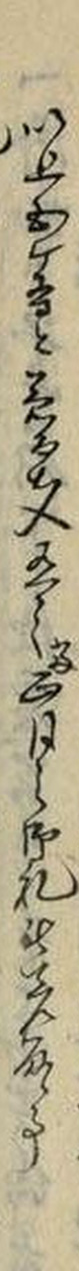以上五ケ寺と兼て出入有之当正月之御礼被差留候事
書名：御城下諸事之部
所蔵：福井県文書館 Fukui Prefectural Archives
